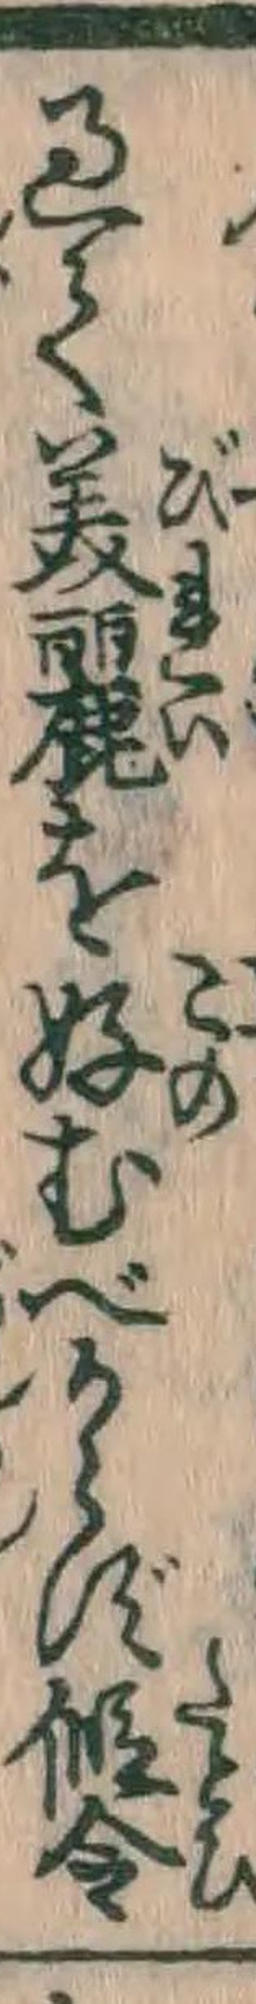過て美麗を好むべからず仮令
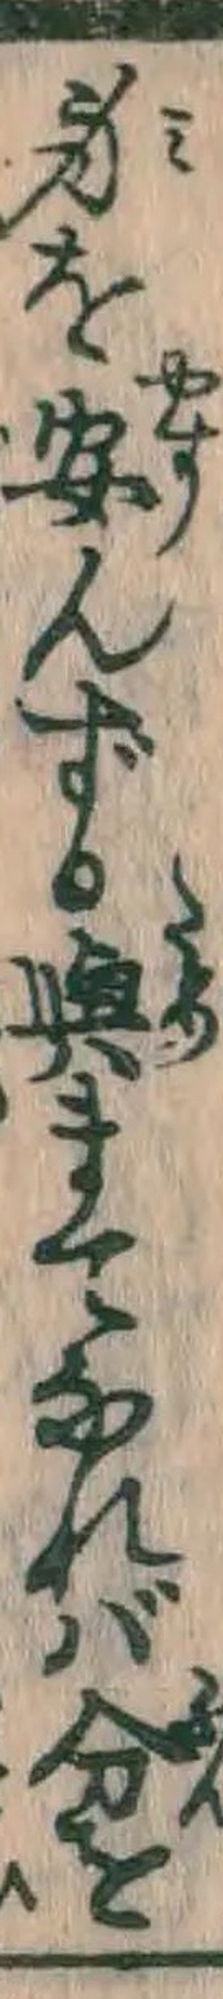身を安んずる與まてなれば分を
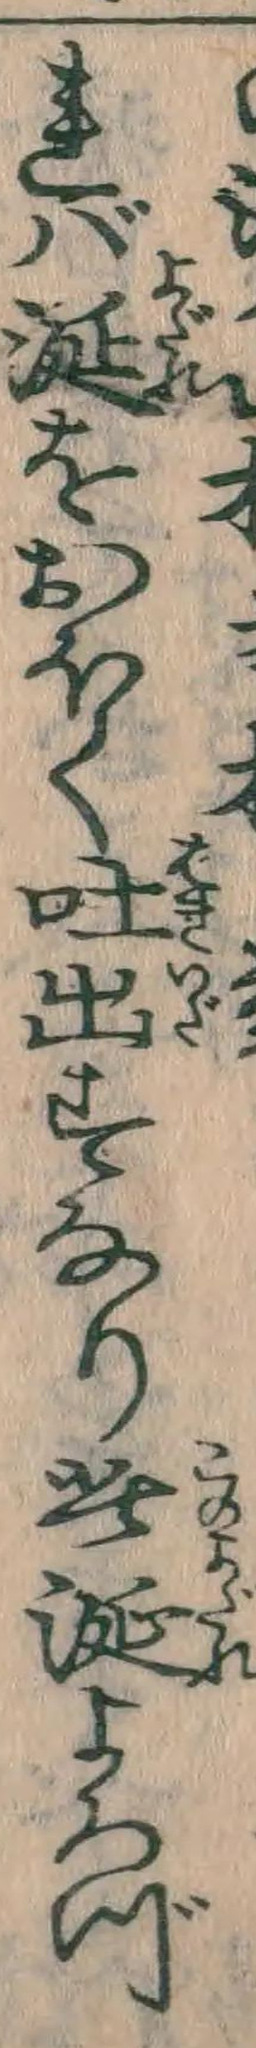れば涎をおほく吐出すなり此涎よろづ
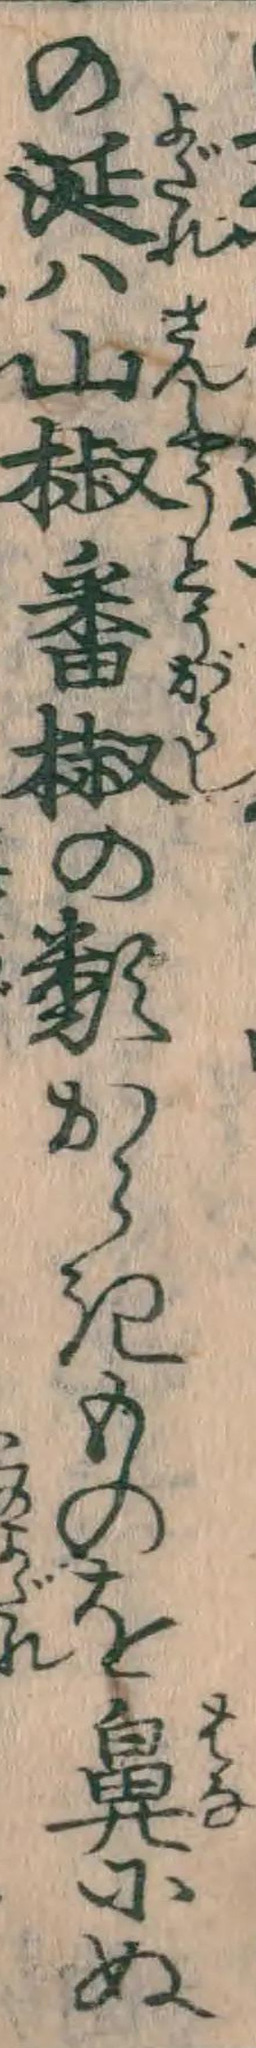の涎は山椒蕃椒の類からきものを鼻にぬ
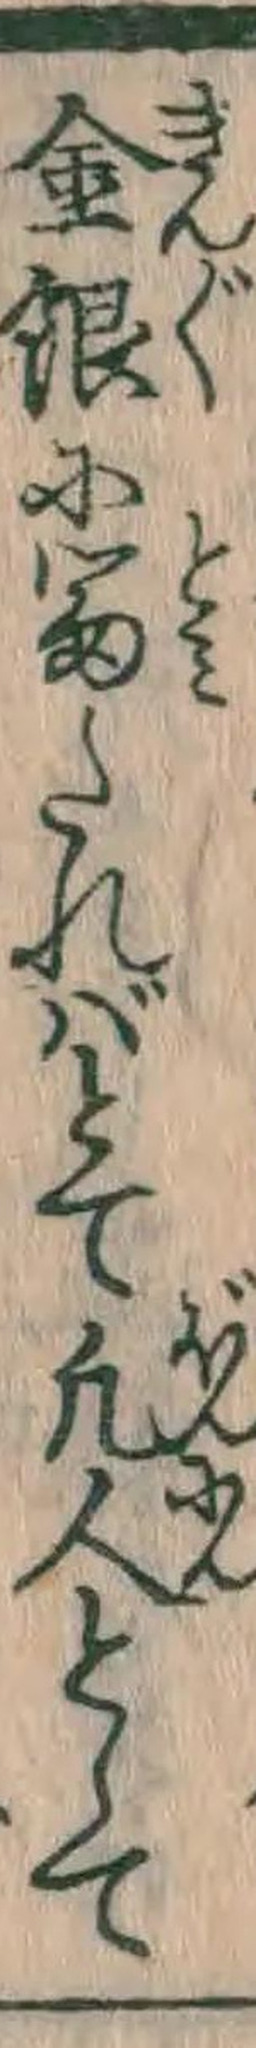金銀に富たればとて凡人として
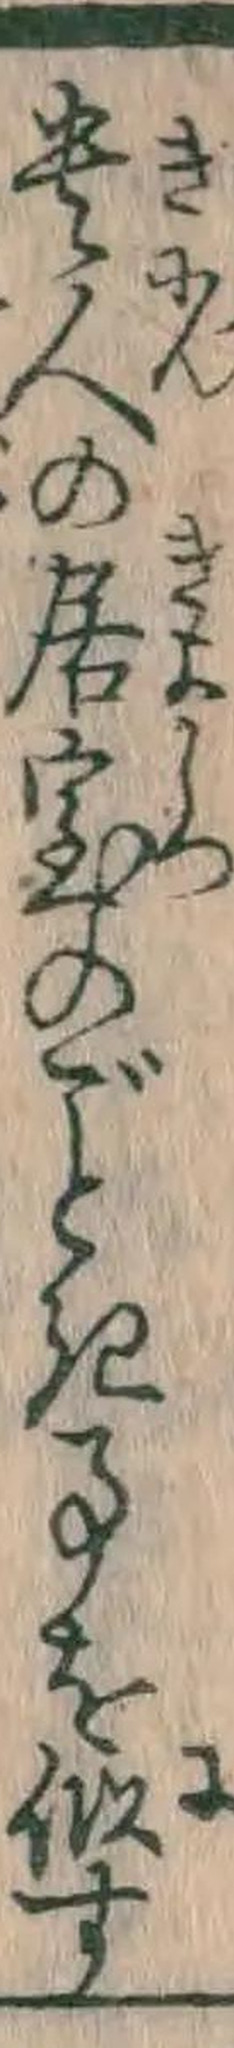貴人の居室のごとき事を似す
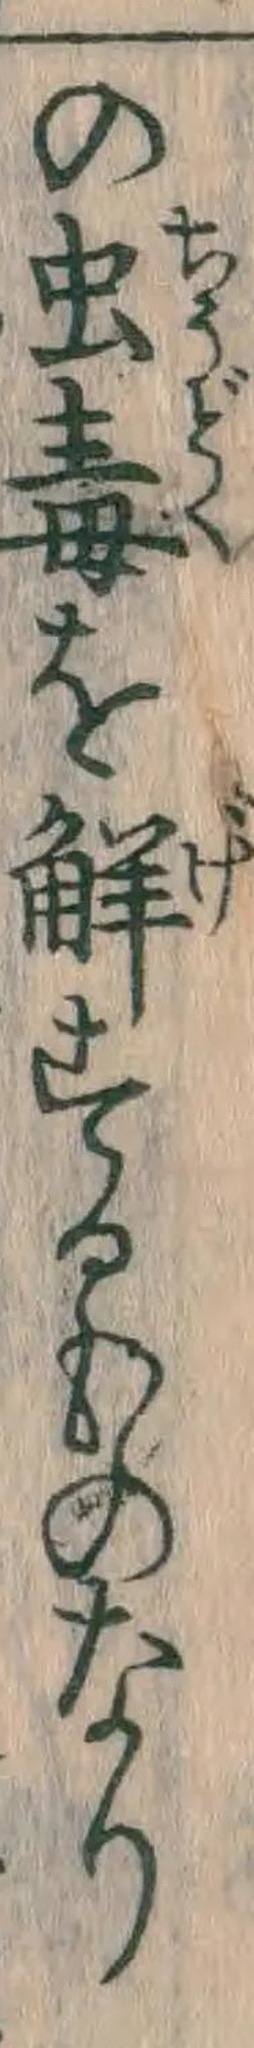の虫毒を解するものなり
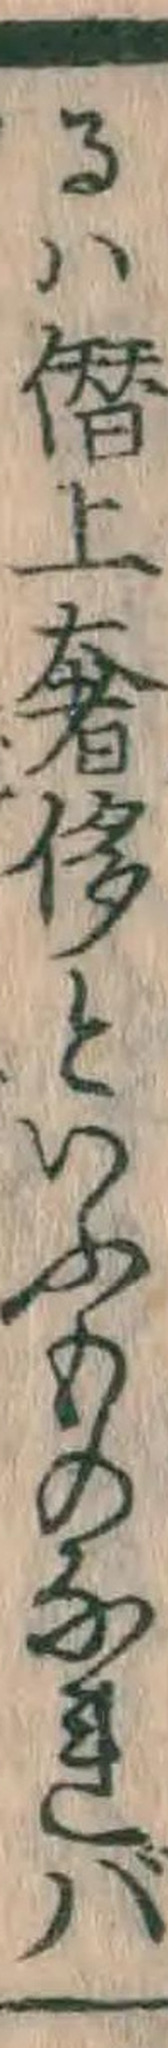るは僭上奢侈といふものなれば
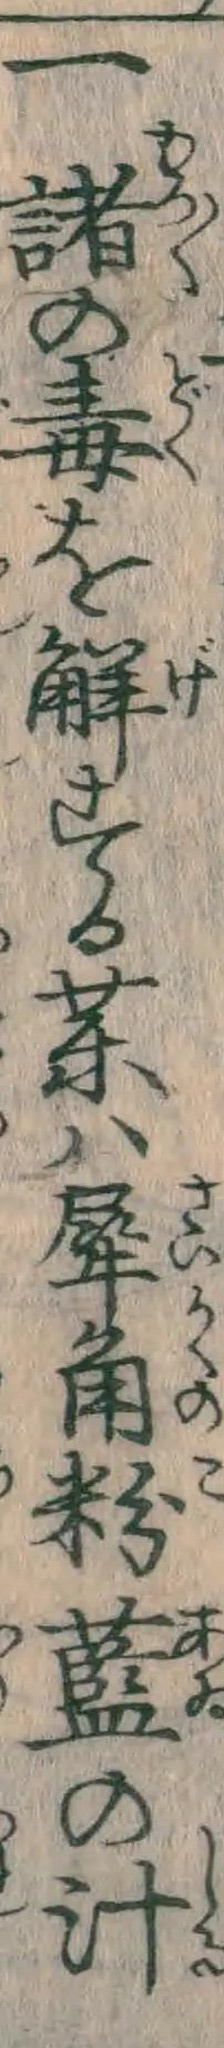一諸の毒を解する薬は犀角粉藍の汁
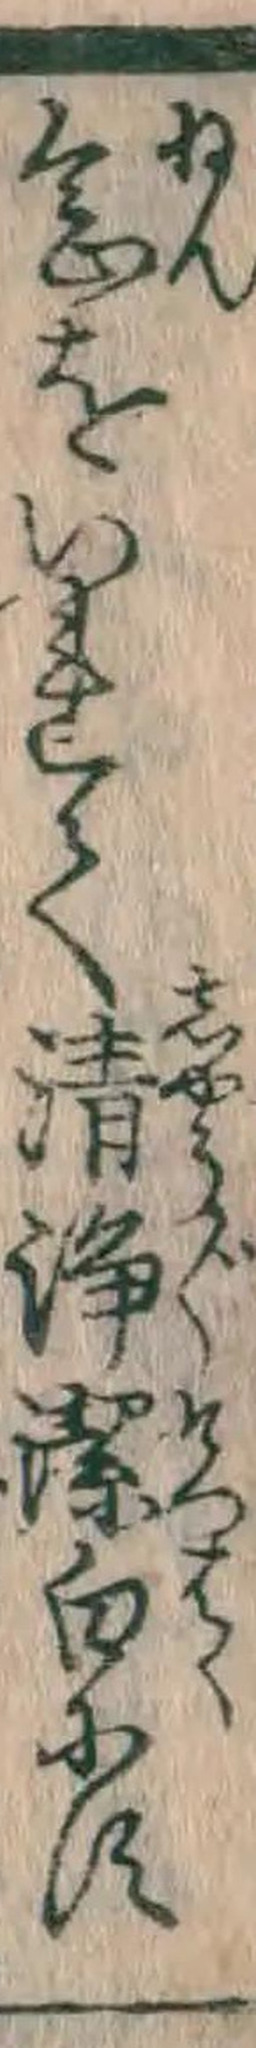念をいれて清浄潔白にす
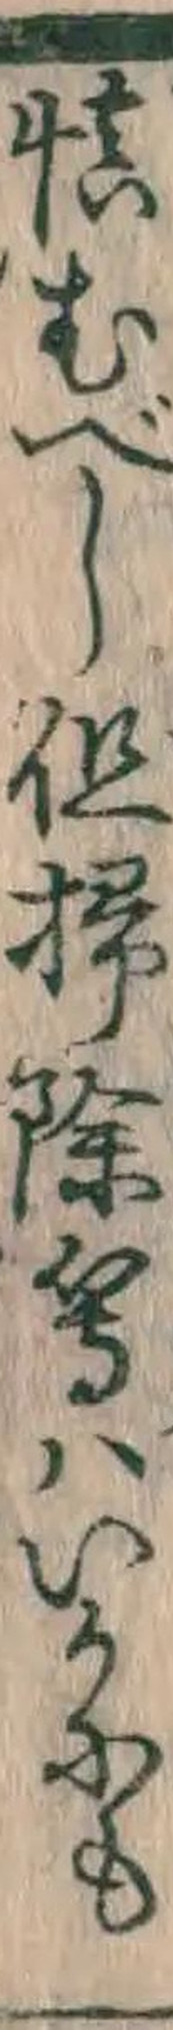慎むべし但掃除等はいかにも
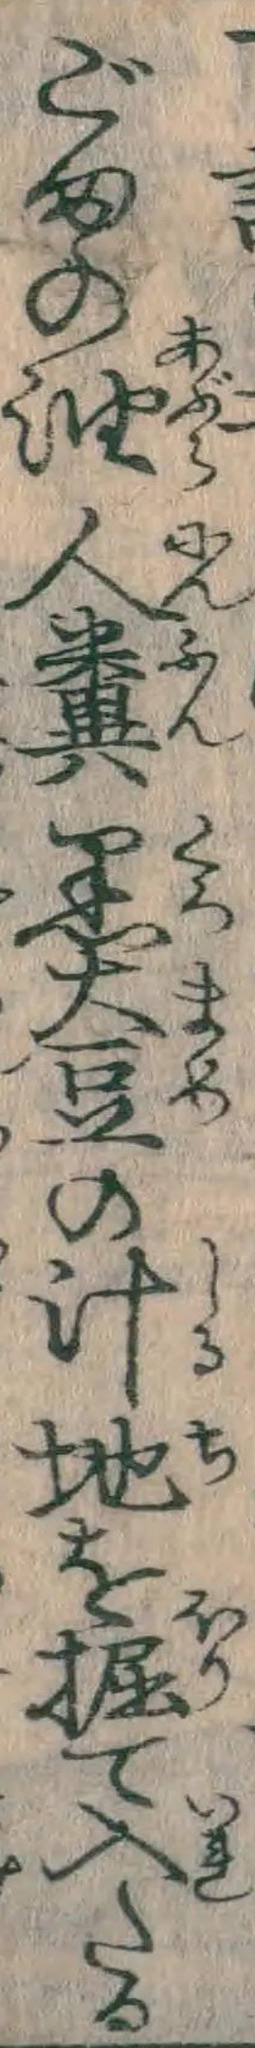ごまの油人糞黒豆の汁地を掘て入たる
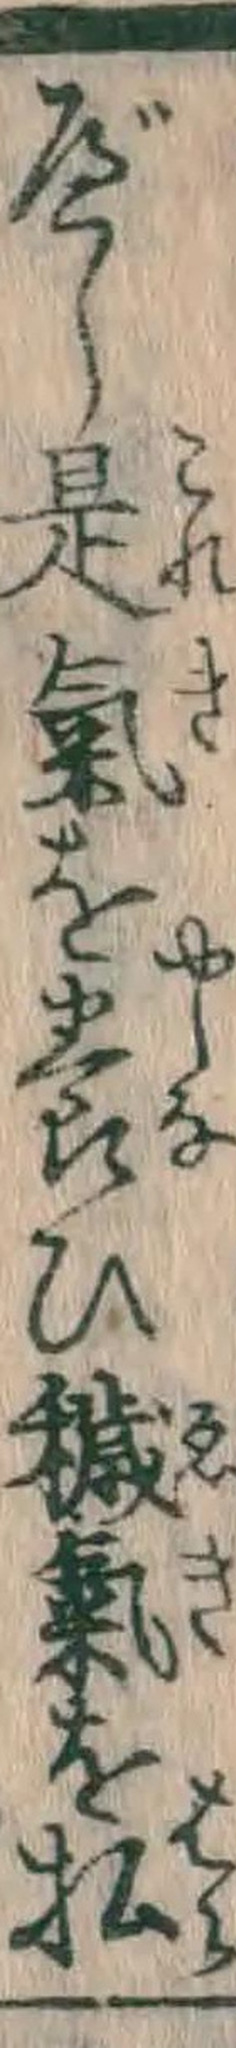べし是気を養ひ穢気を払
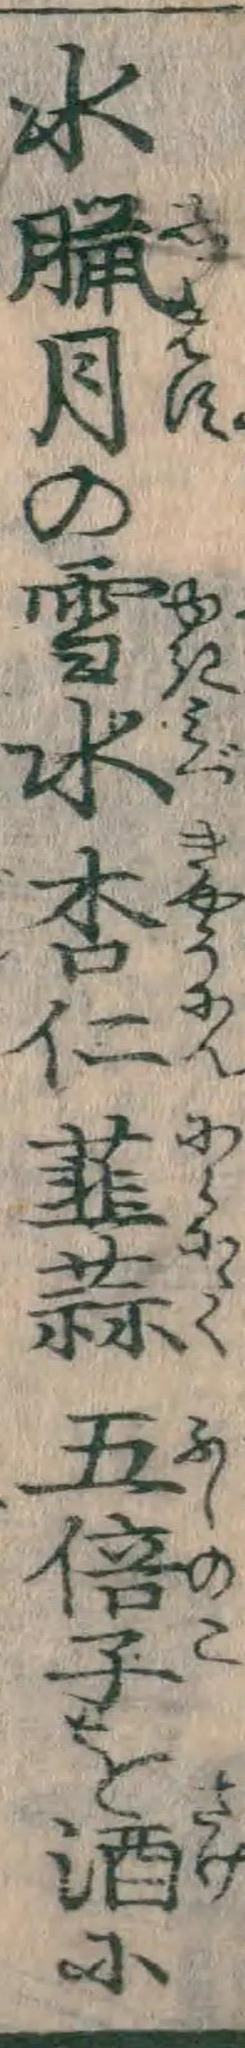水臘月の雪水杏仁韮蒜五倍子を酒に
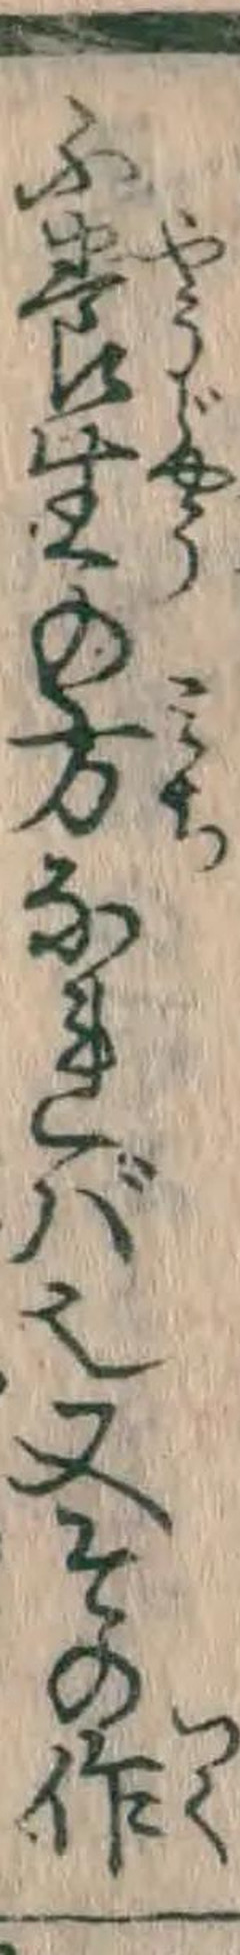ふ養生の方なれば也又その作
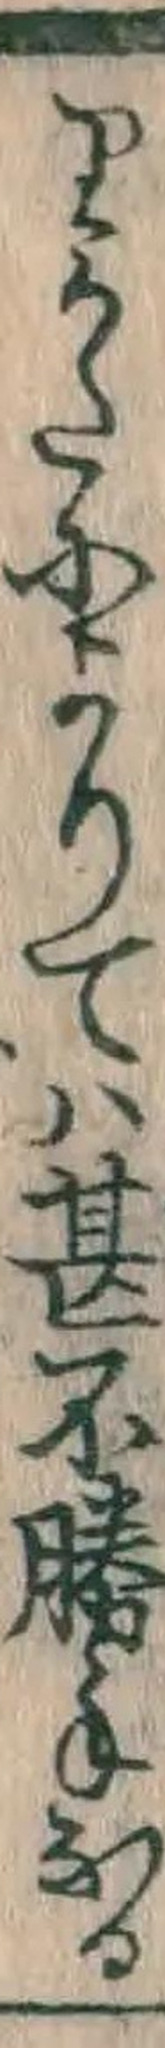りかたによりては甚不勝手なる
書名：広益秘事大全 3巻. [3]
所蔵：国立国会図書館 National Diet Library, JAPAN
